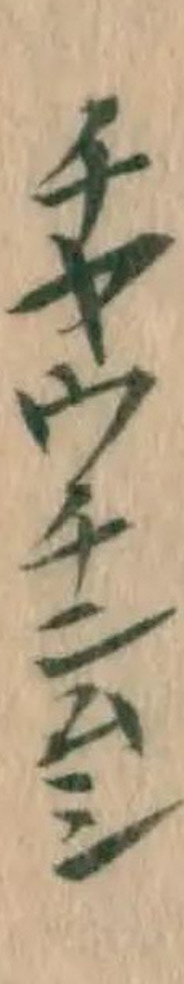チヤウチンムシ
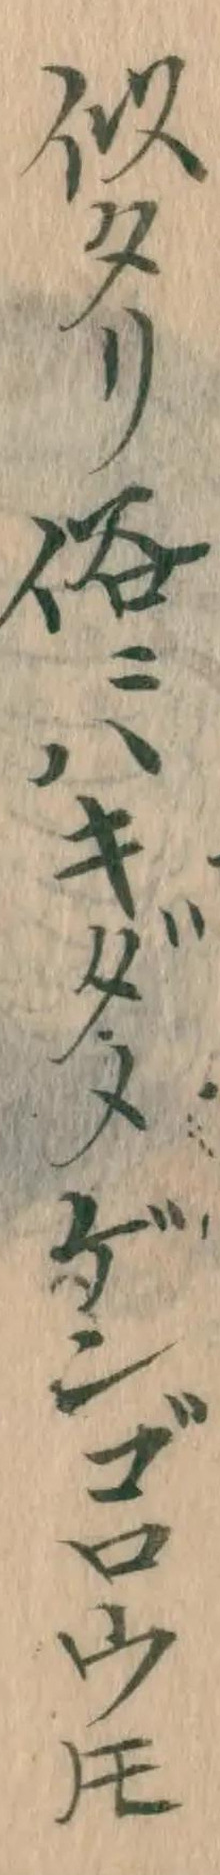似タリ俗ニハキダメゲンゴロウトモ
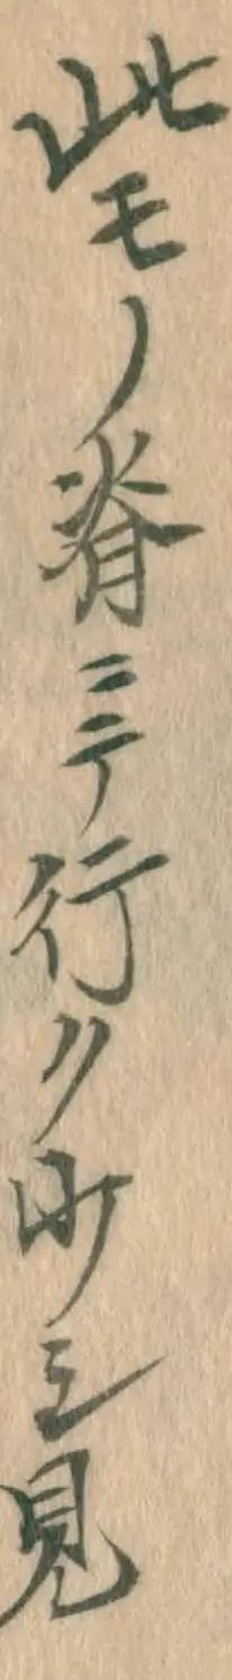此モノ脊ニテ行ク少シ見
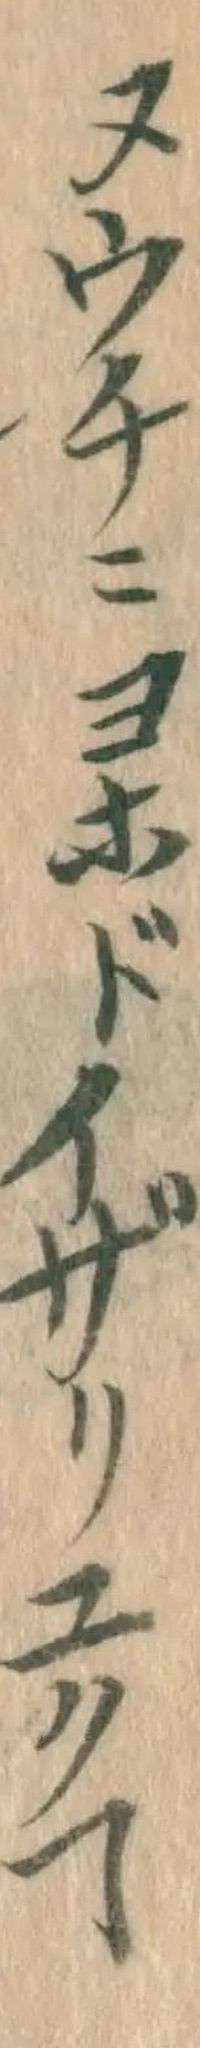ヌウチニヨホドイザリユクコト
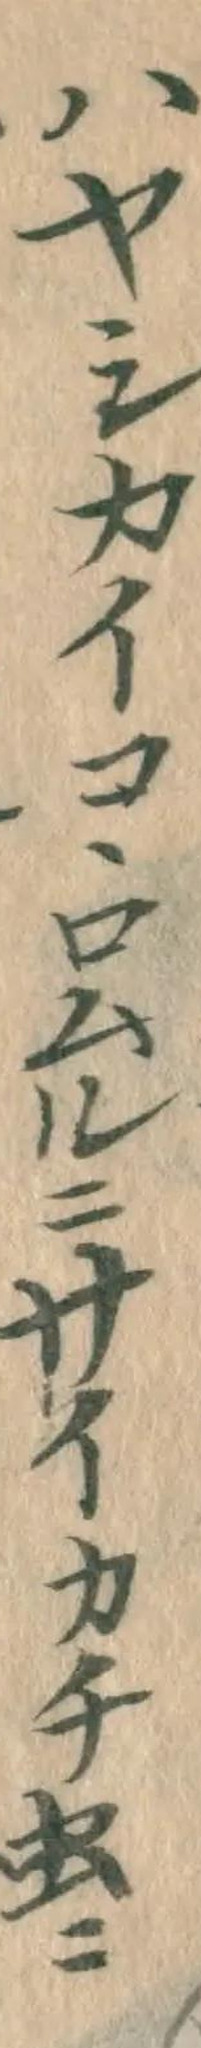ハヤシカイコヽロムルニサイカチ虫ニ
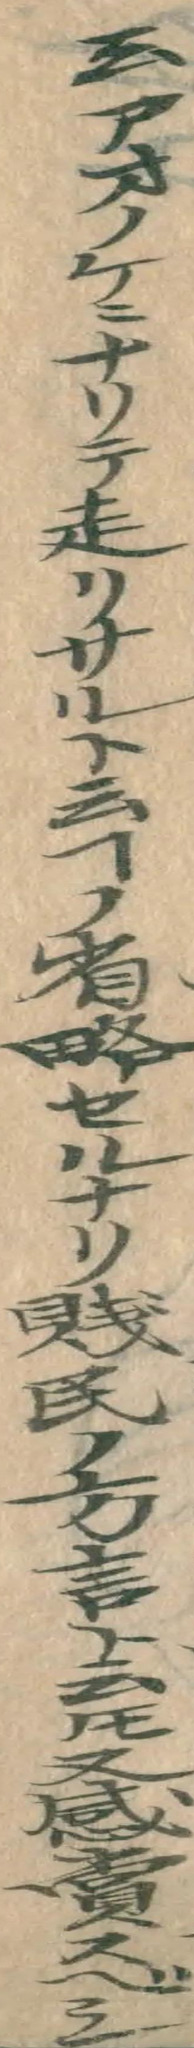云アオノケニナリテ走リサルト云コトノ省略セルナリ賎民ノ方言ト云トモ又感賞スベシ

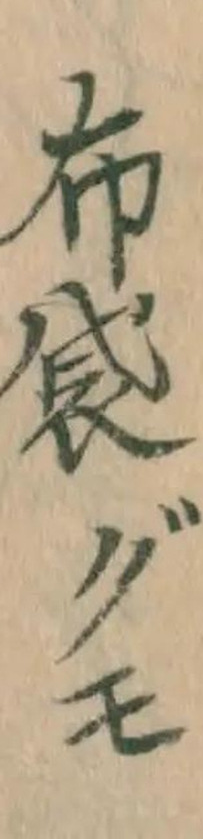布袋グモ
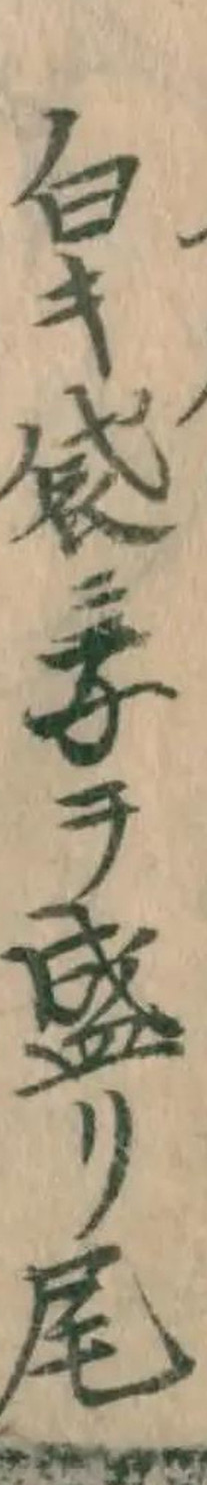白キ袋ニ子ヲ盛リ尾
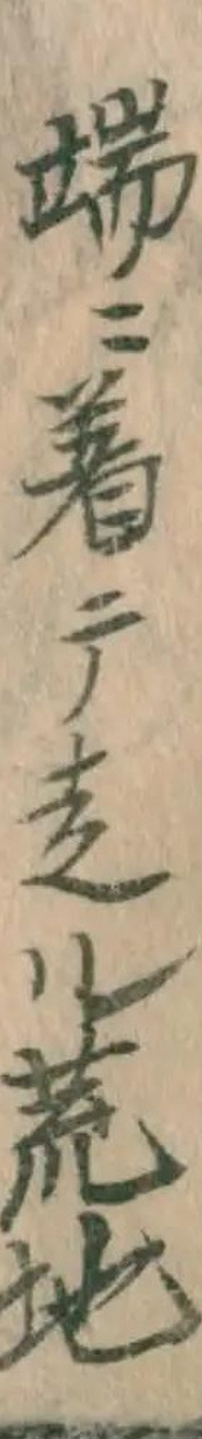端ニ着テ走ル荒地
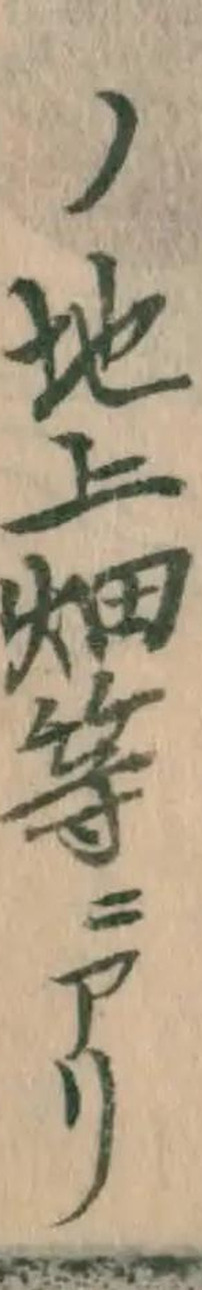ノ地上畑等ニアリ
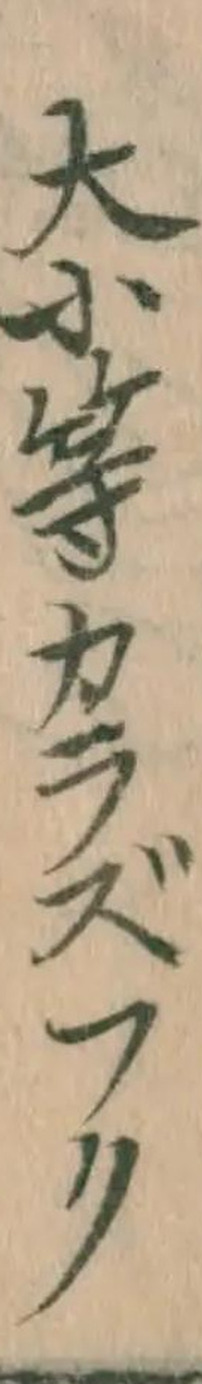大小等カラズフク
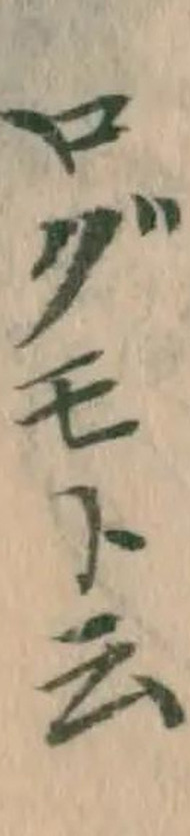ログモト云
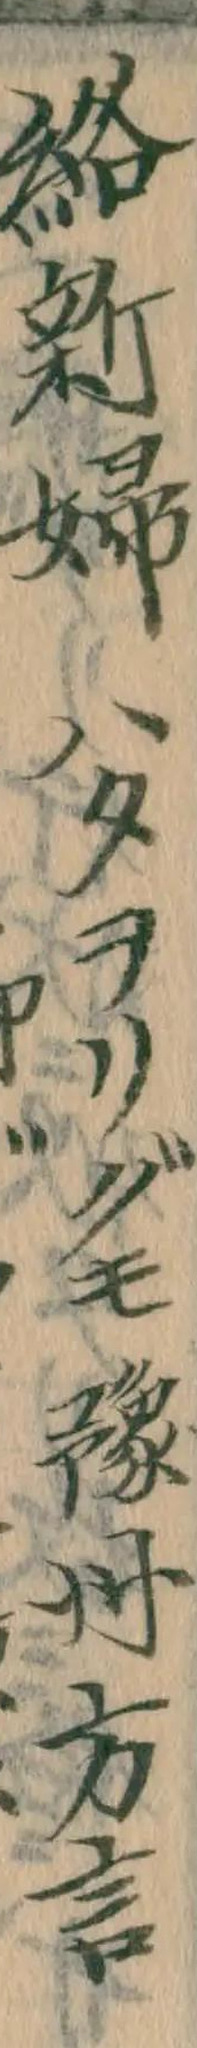絡新婦ハタヲリグモ豫州方言
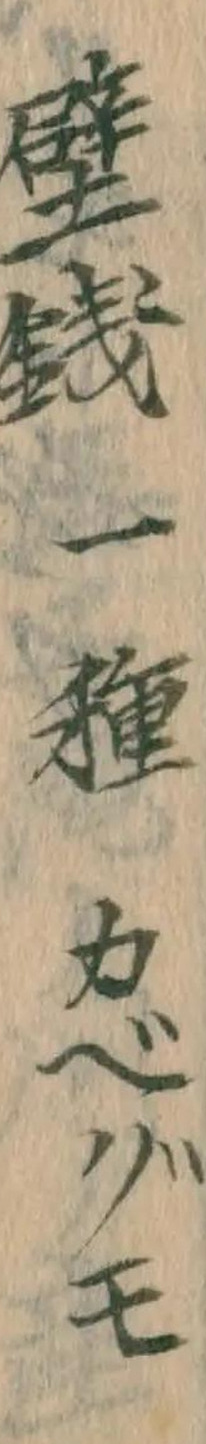壁銭一種カベグモ
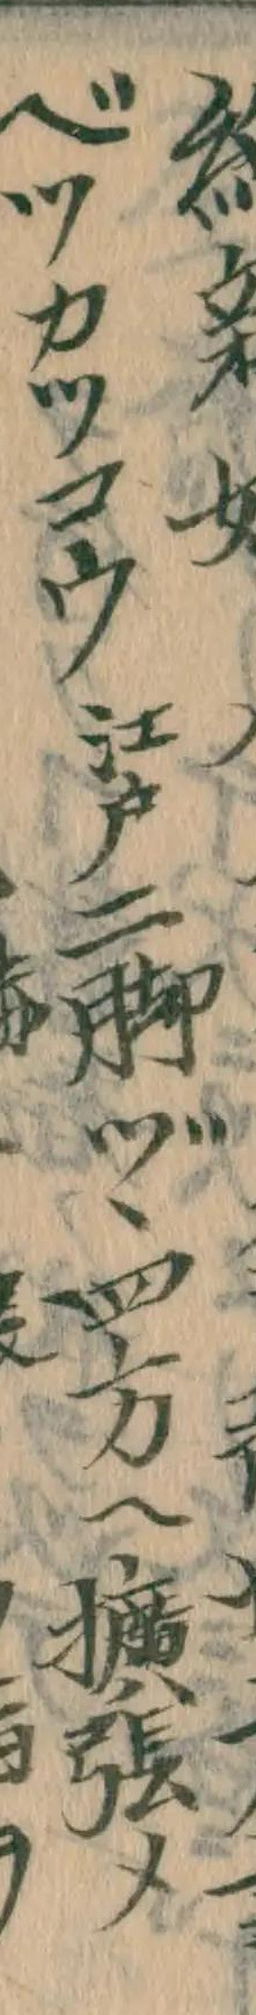ベツカツコウ江戸二脚ヅヽ四方ヘ擴張シテ
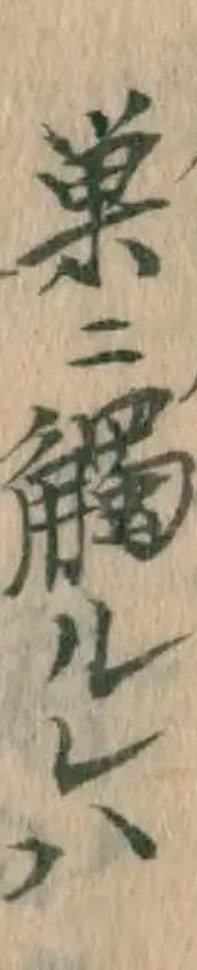巣ニ觸ルレハ
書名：千蟲譜 3巻. [2]
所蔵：国立国会図書館 National Diet Library, JAPAN
